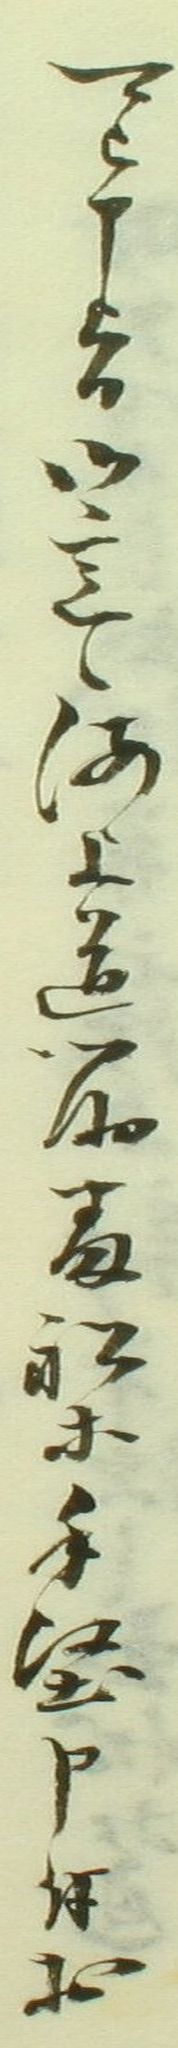可被申旨御意候海上道筋番船等手堅申付於
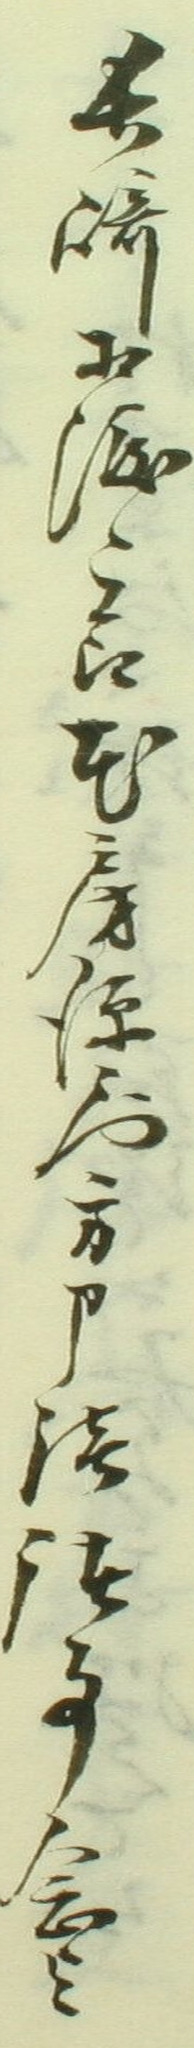長崎相渡候節花房源右衛門方申談諸事念を
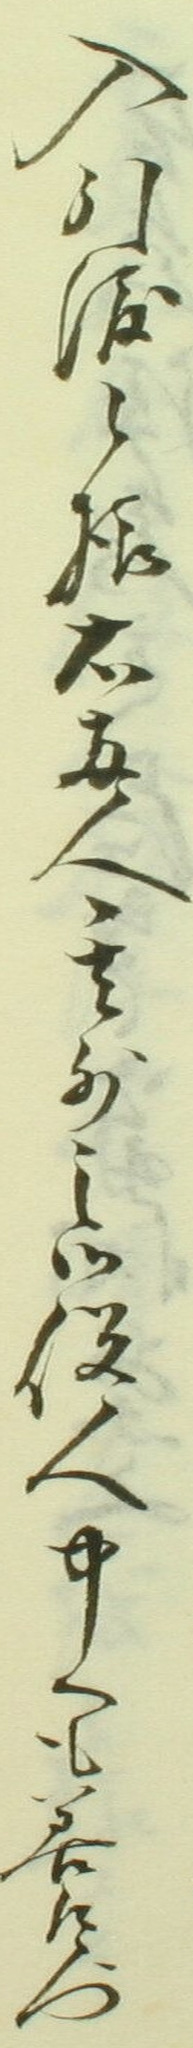入引渡候様右両人其外之御役人中へも善左衛門
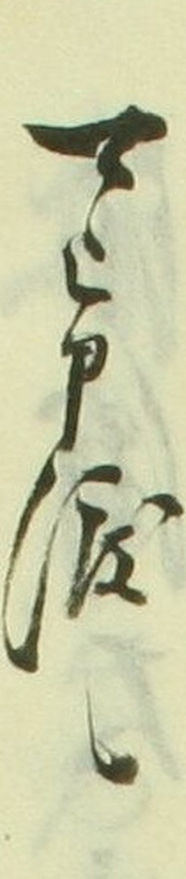可被申渡候
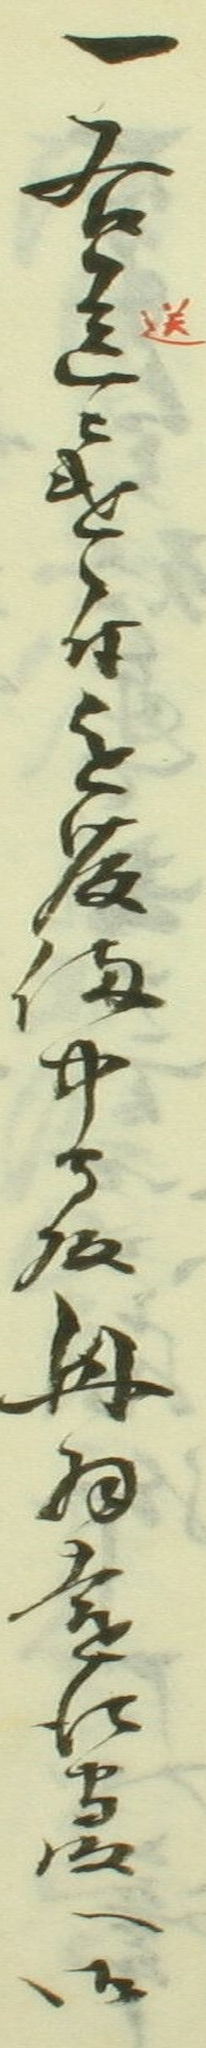一右送被遣候付近藤備中守殿丹羽遠江守殿へ御
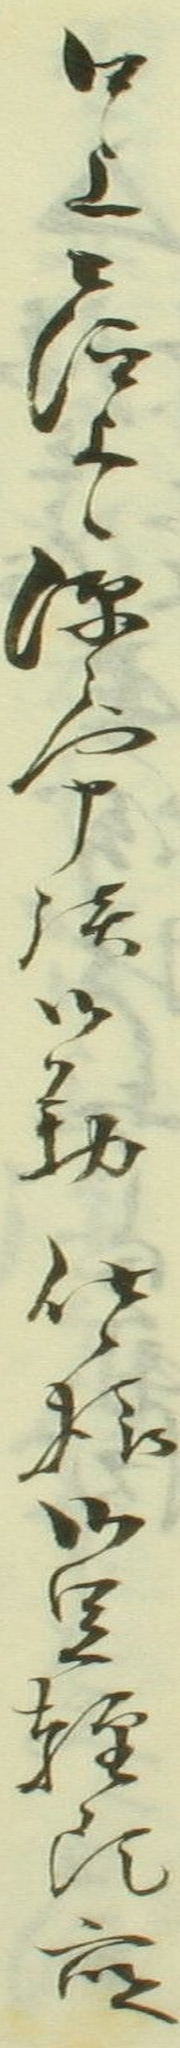口上被仰上候源右衛門申談御勤仕候様御足軽頭衆へ
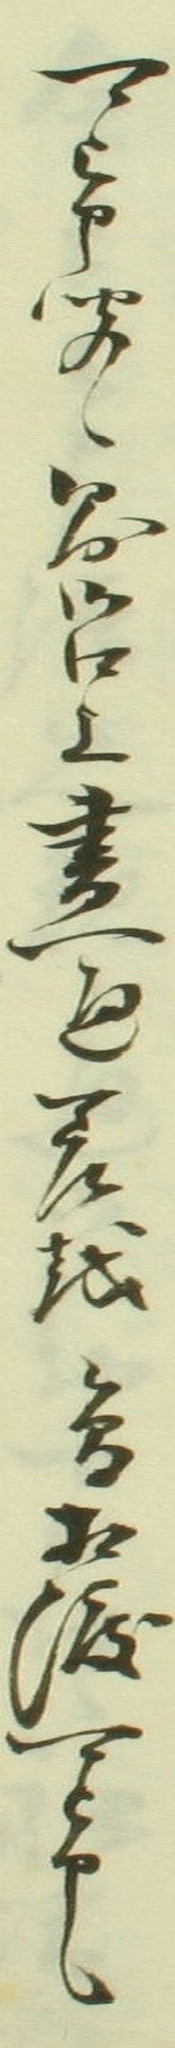可被申聞候則御口上書一通差越候間相渡可被申候
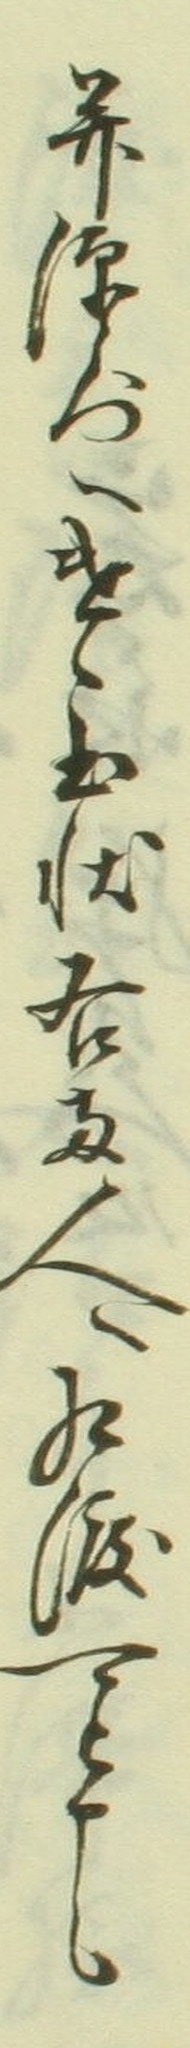并源右衛門へ遣候書状右両人へ相渡可被申候
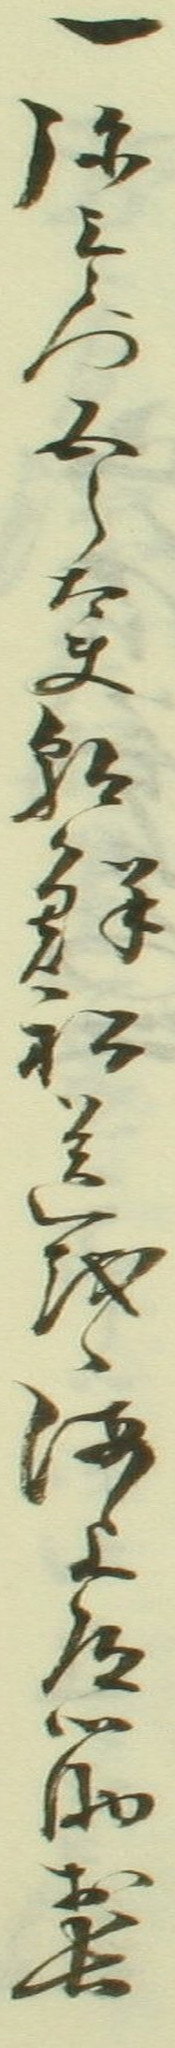一弥三右衛門五郎大夫朝鮮船送越候海上道筋於長
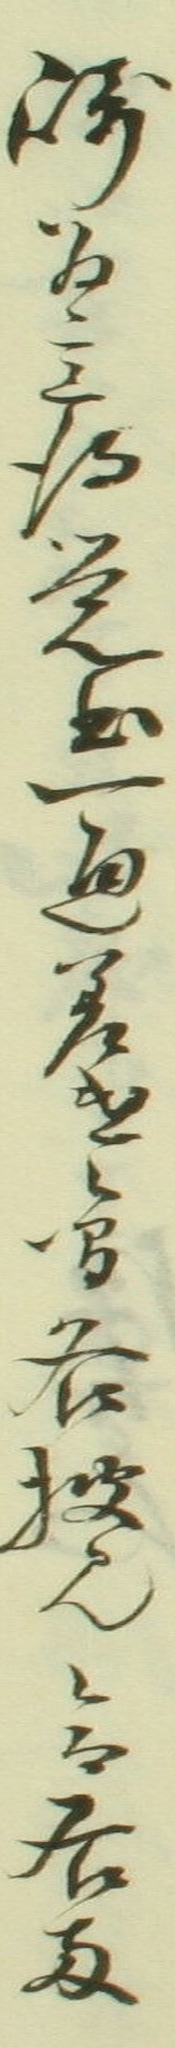崎為意得覚書一通差遣候間各被見候而右両
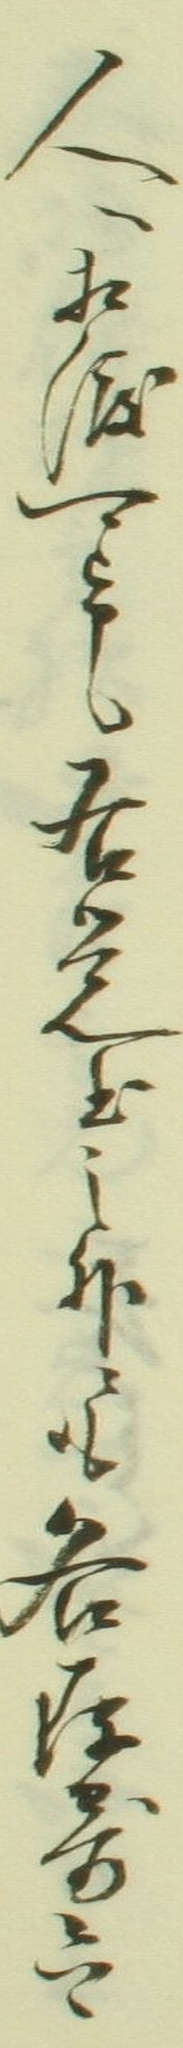人へ相渡可被申候右覚書之外ニも各存寄候ハヽ
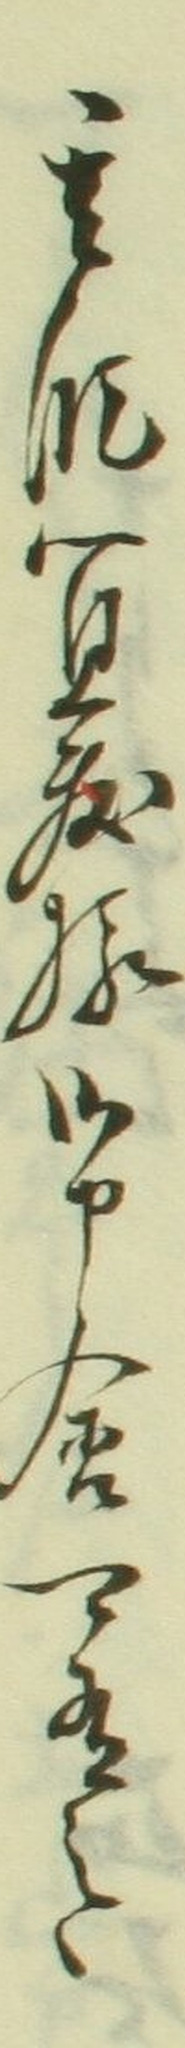其段宜敷様御申含可有之候
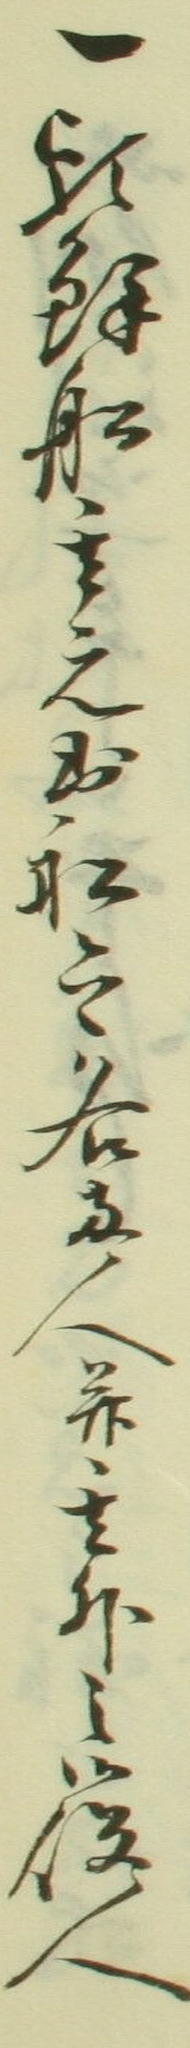一朝鮮船其元出船候ハヽ右両人并其外之御役人

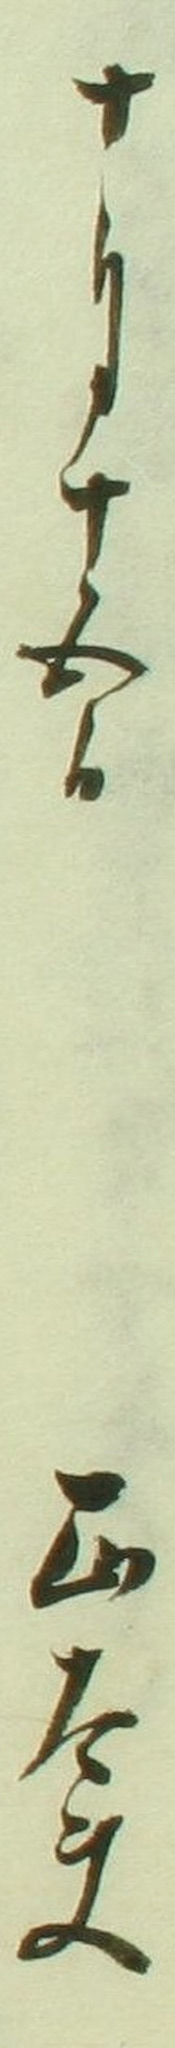十月十五日正大夫
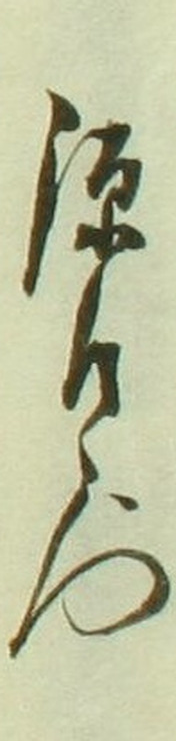源左衛門
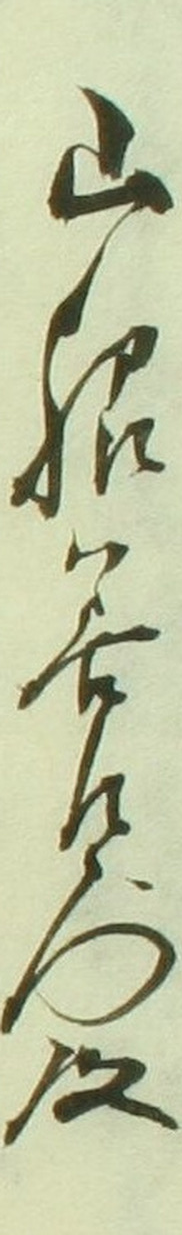山脇善左衛門殿
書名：異国船漂着記
